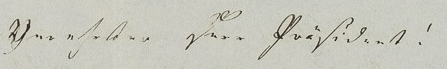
Verehrter Herr Präsident!
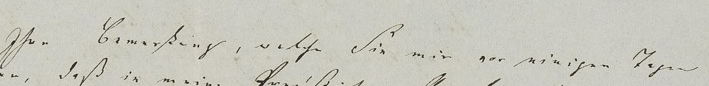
Ihre Bemerkung, welche Sie mir vor einigen Tagen
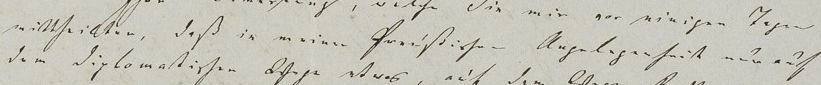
mittheilten, daß in meiner Preußischen Angelegenheit nur auf
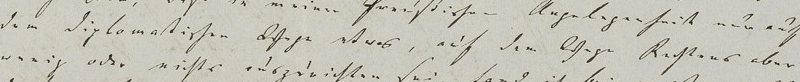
dem diplomatischen Wege etwas, auf dem wege Rechtens aber
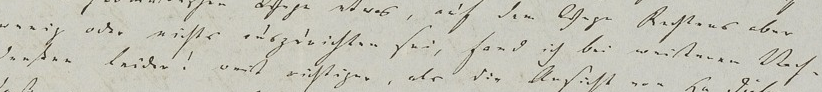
wenig oder nichts auszurichten sei, fand ich bei weiterem Nach-
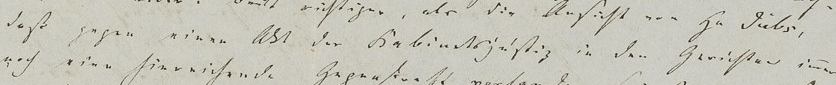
daß gegen einen Akt der Cabinetsjustiz in den Gerichten immer
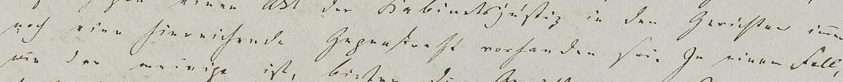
noch eine hinreichende Gegenkraft vorhanden sei. In einem Fall,
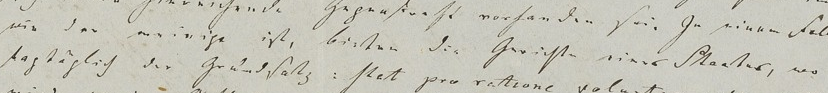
wie der meinige ist, bieten die Gerichte eines Staates, wo
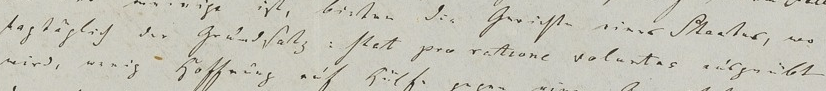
tagtäglich der Grundsatz: stat pro ratione voluntas ausgeübt
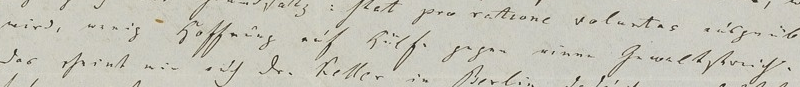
wird, wenig Hoffnung auf Hülfe gegen einen Gewaltstreich.
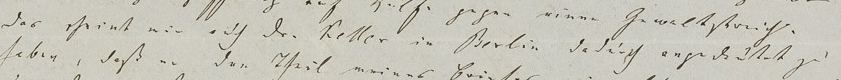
Das scheint mir auch Dr. Keller in Berlin dadurch angedeutet zu
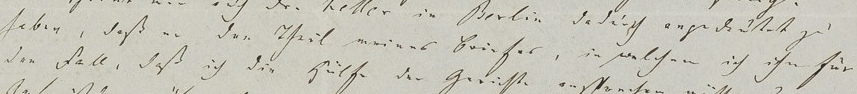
haben, daß er den Theil meines Briefes, in welchem ich ihn für
